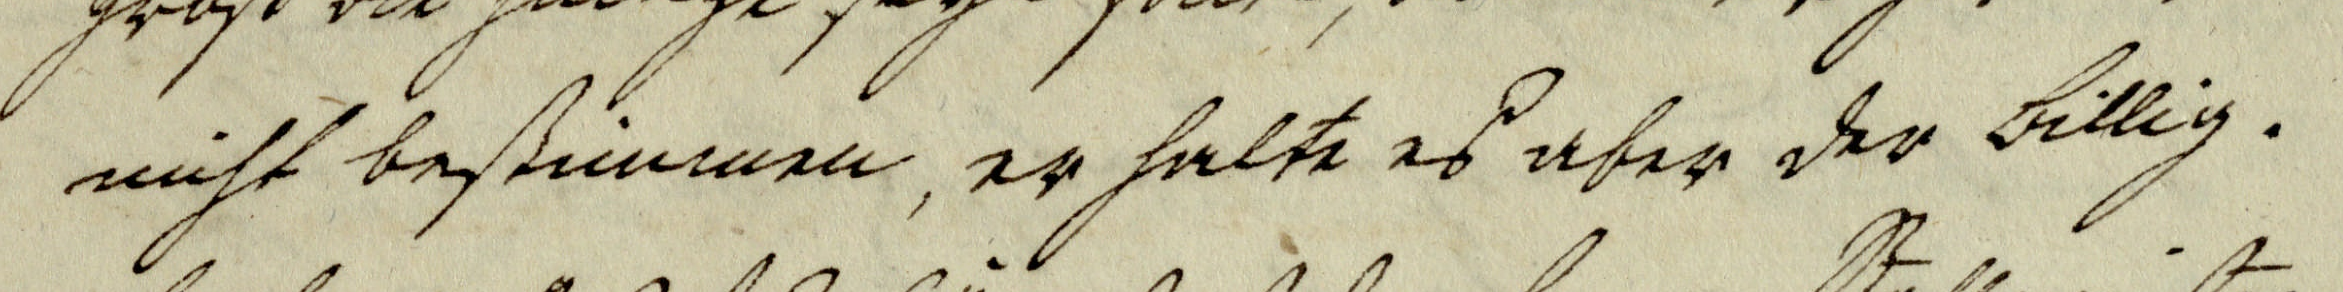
nicht bestimmen, er halte es aber der Billig¬
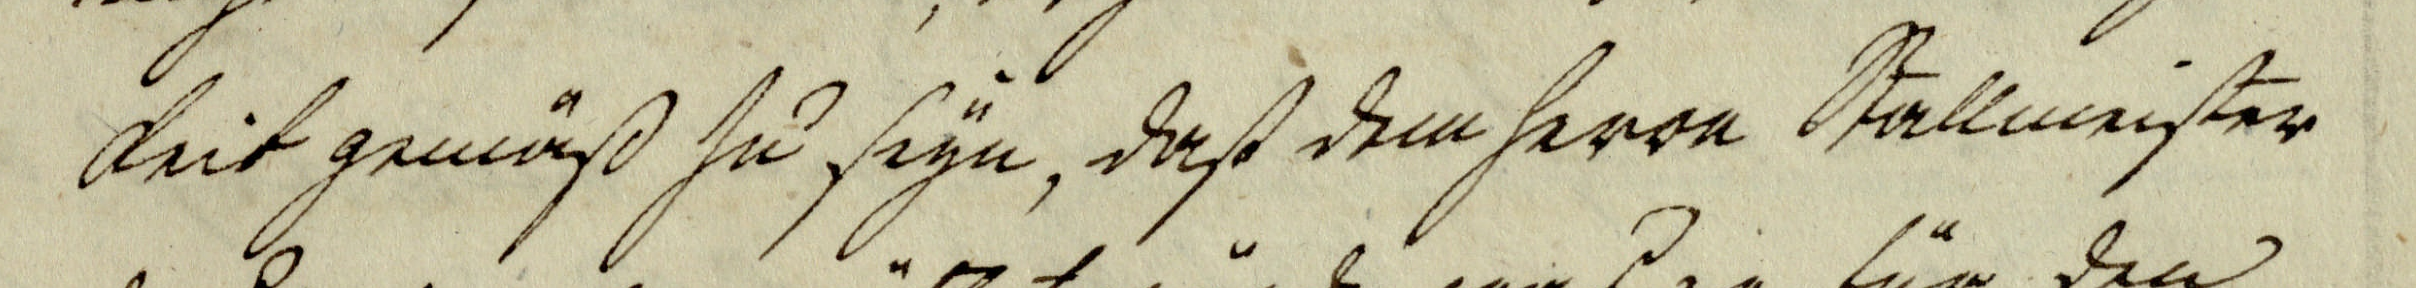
keit gemäß zu seÿn, daß dem Herrn Stallmeister
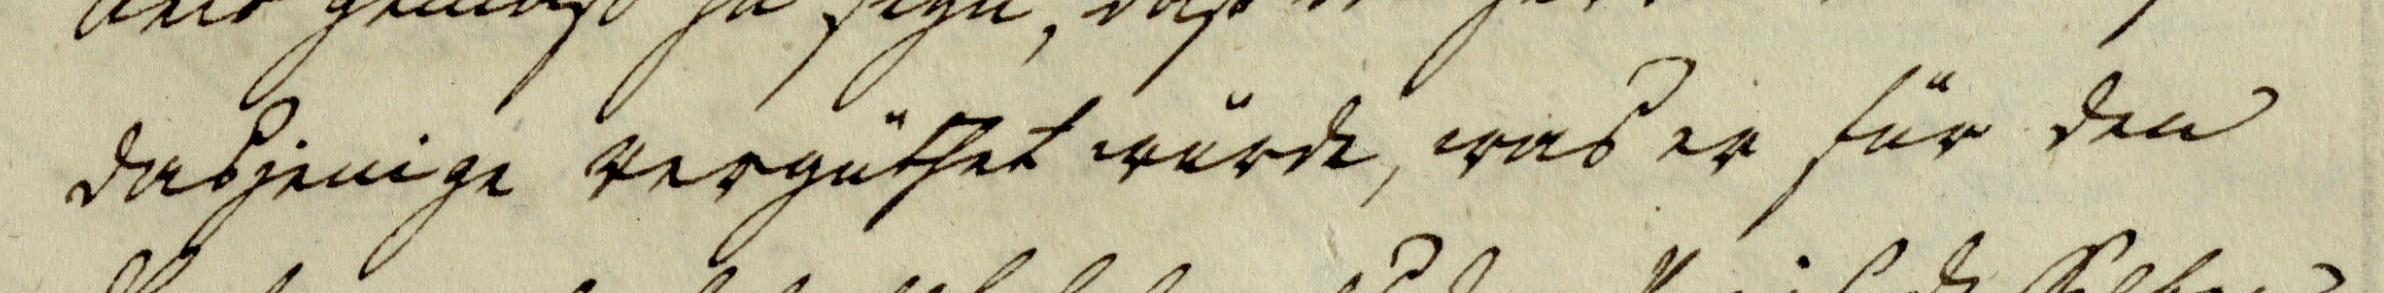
dasjenige vergüthet würde, was er für den
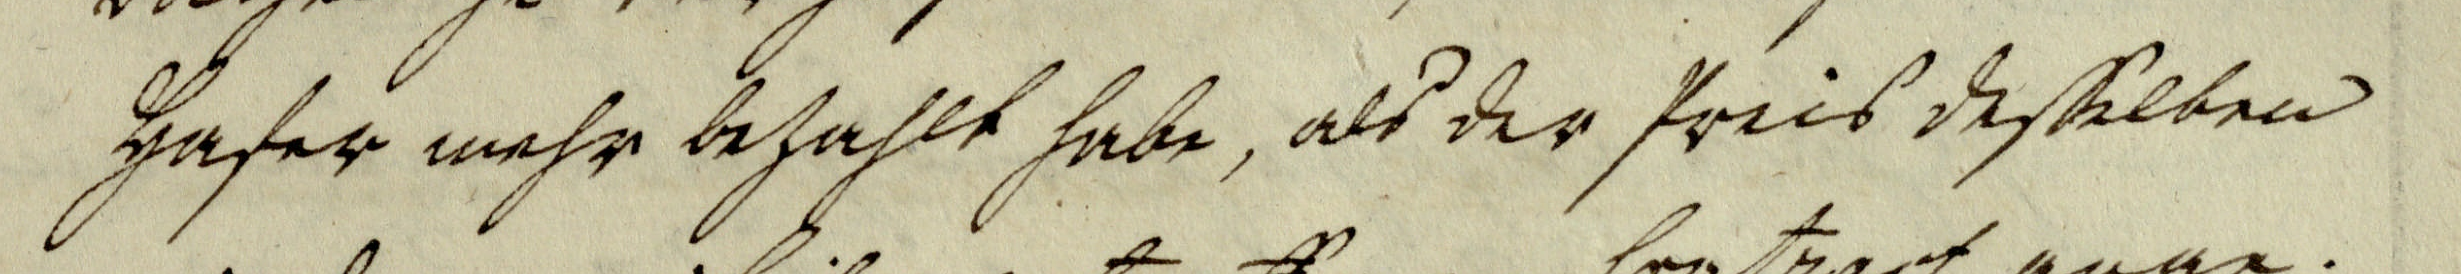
Hafer mehr bezahlt habe, als der Preis desselben
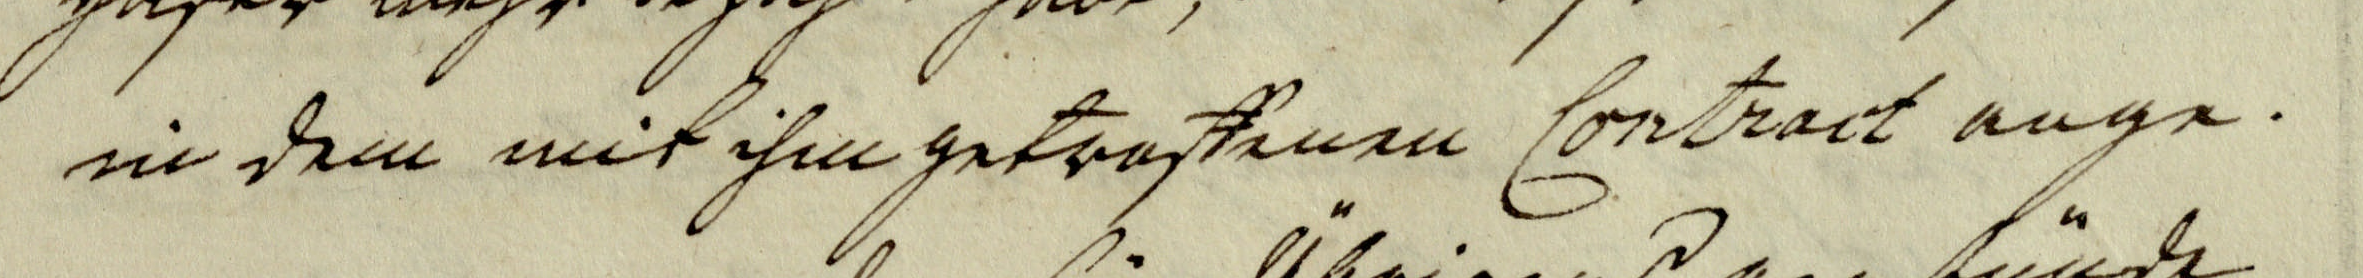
in dem mit ihm getroffenen Contract ange¬
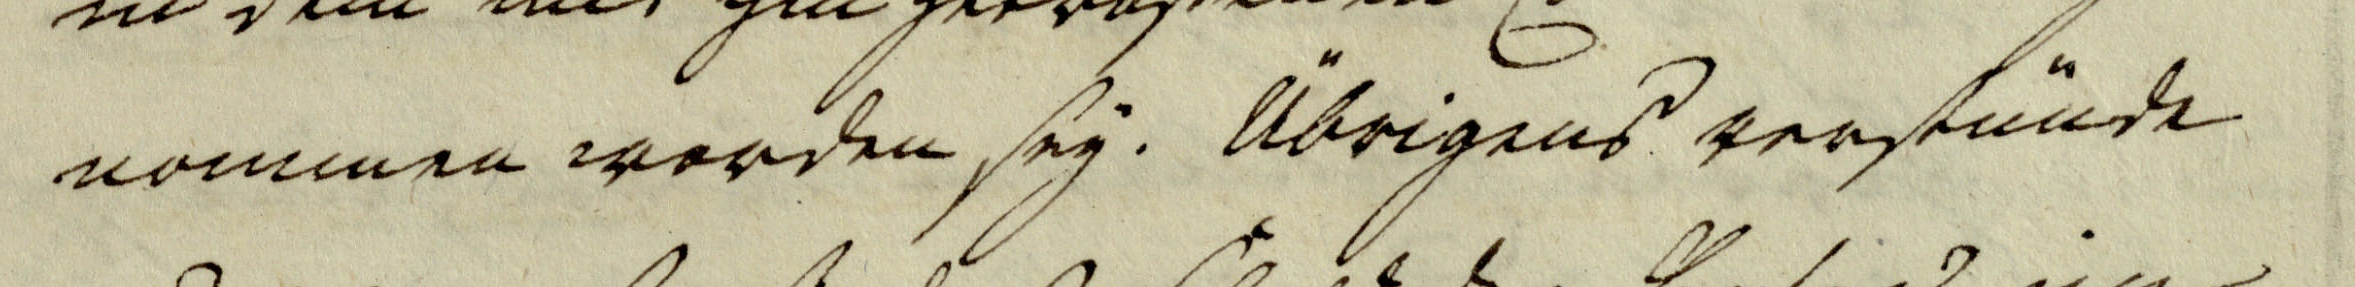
nommen worden seÿ. Übrigens verstünde
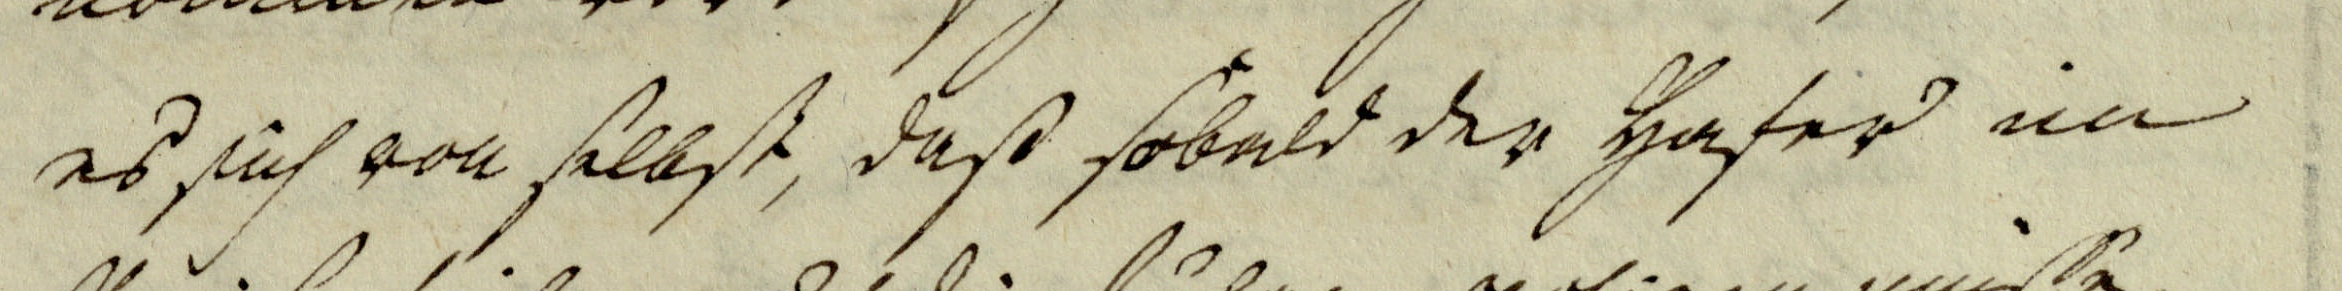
es sich von selbst, daß sobald der Hafer im
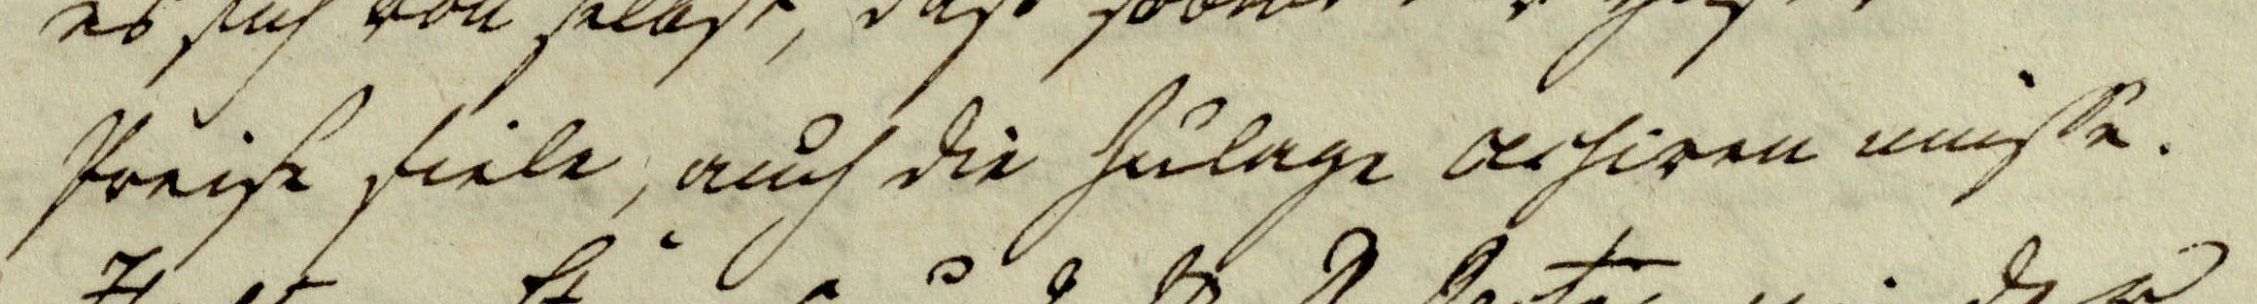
Preise viele, auch die Zulage cessiren müsse.
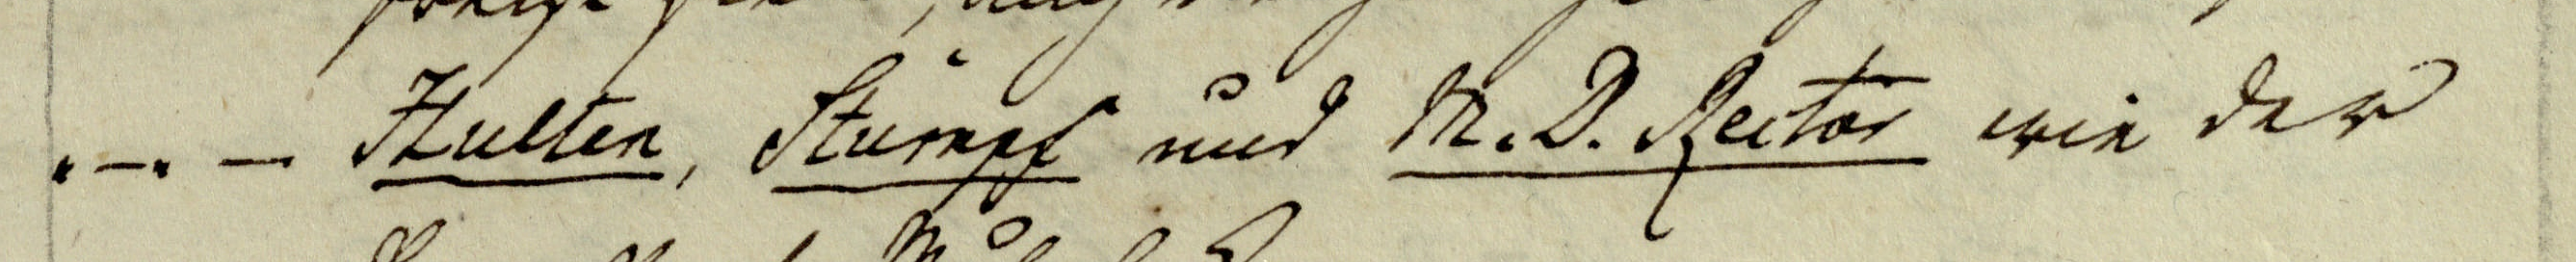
Hulten, Stumpf. und M. D. Rector wie der
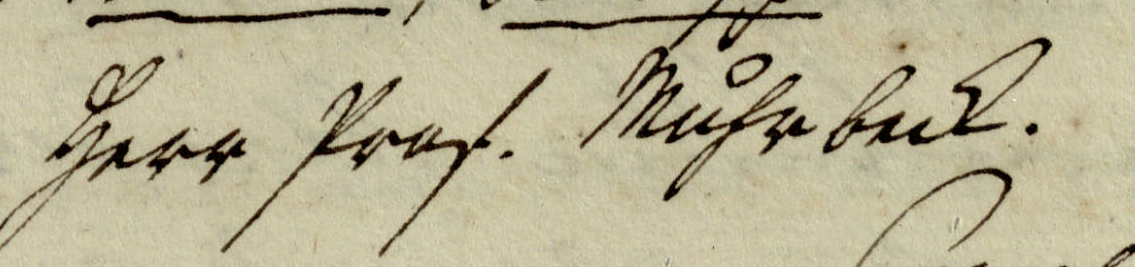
Herr Prof. Muhrbeck.
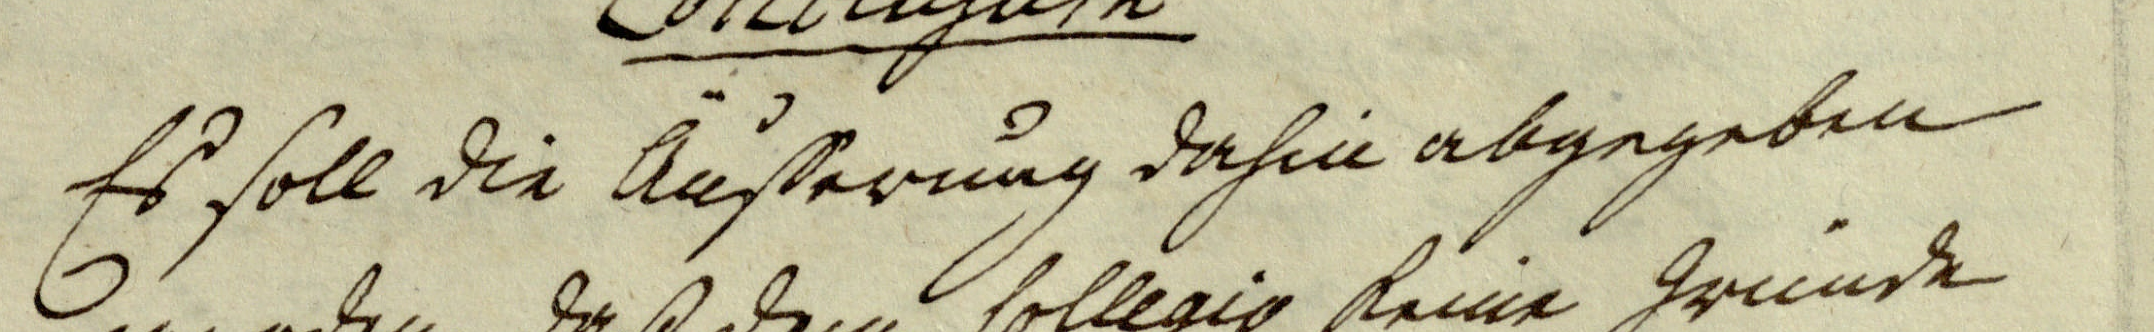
Es soll die Äusserung dahin abgegeben
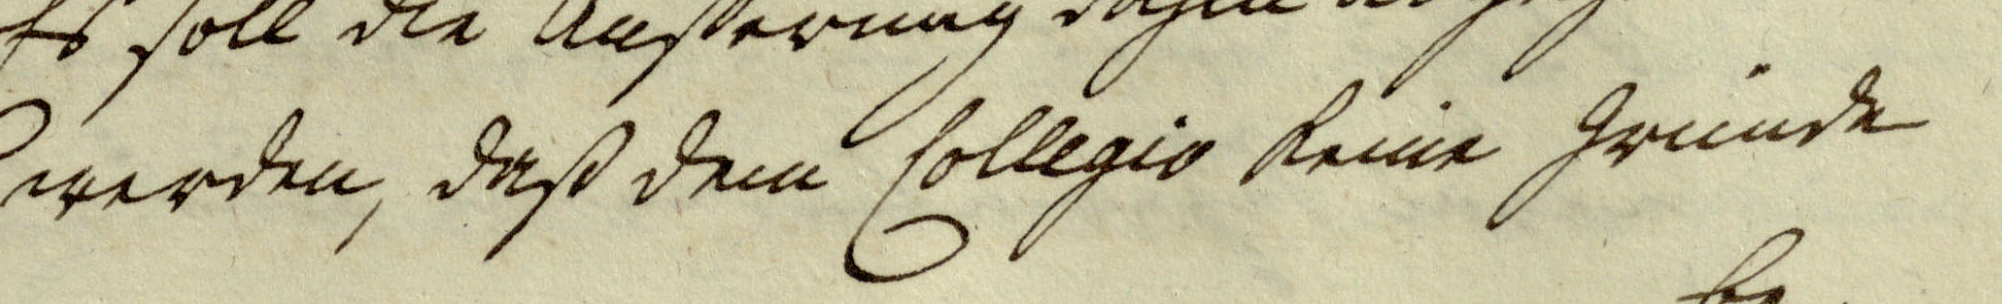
werden, daß dem Collegio keine Gründe
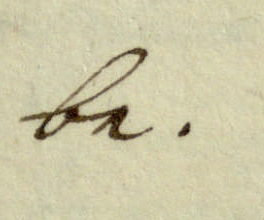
be¬
